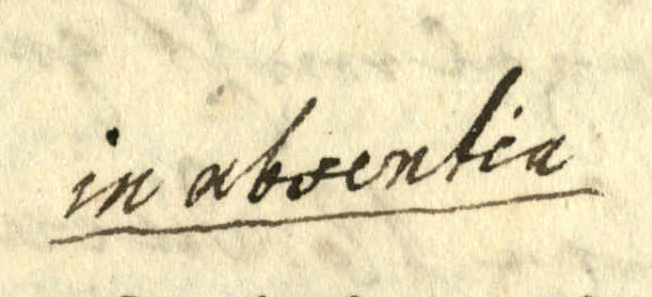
in absentia
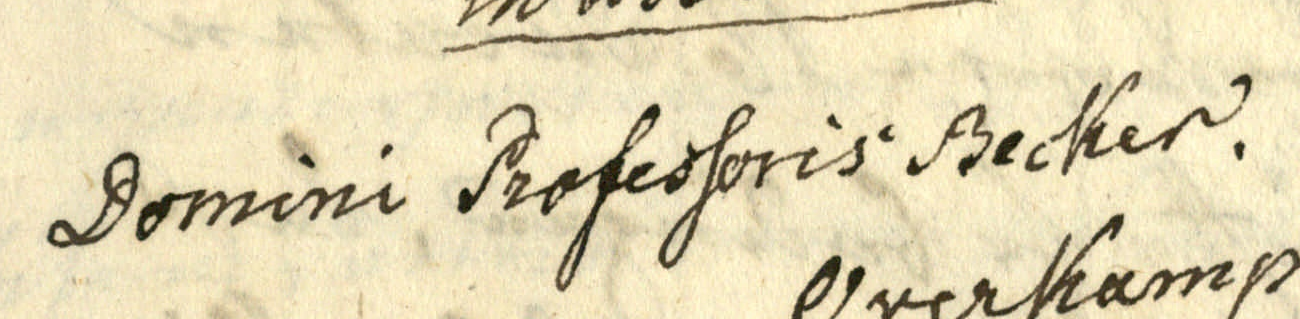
Domini Professoris Becker.
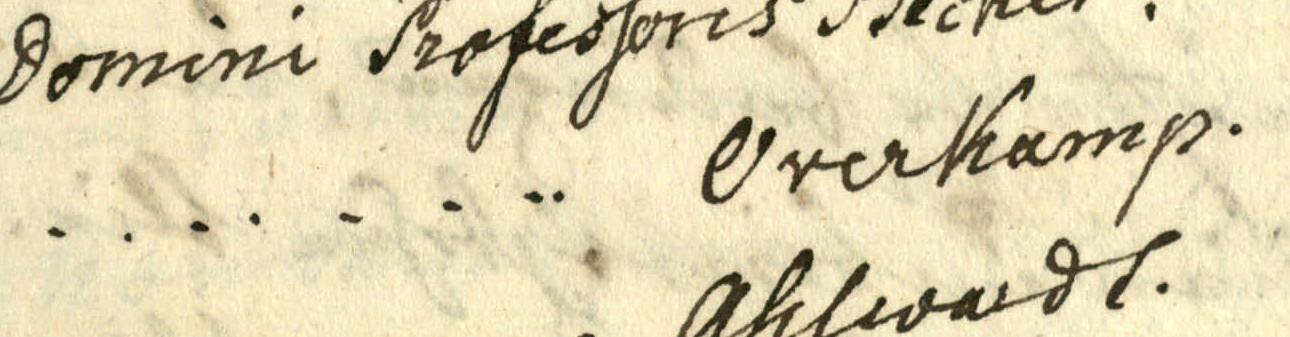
Overkamp.
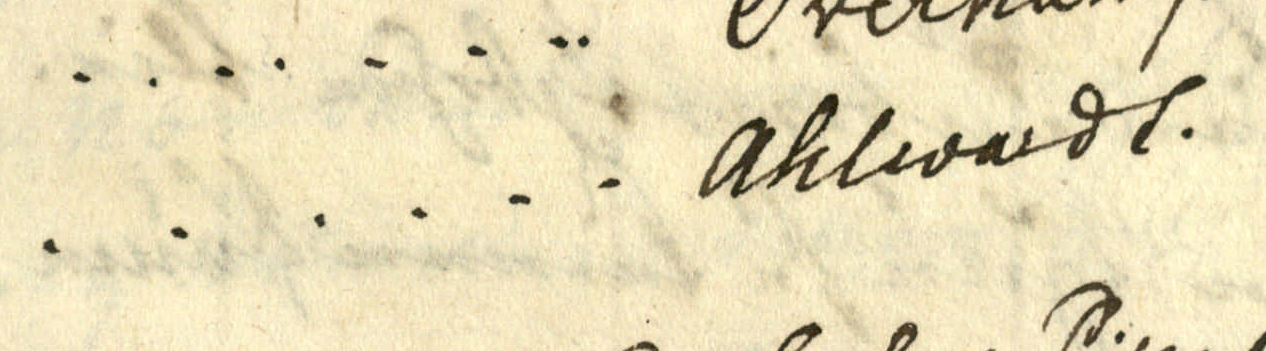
Ahlwardt.
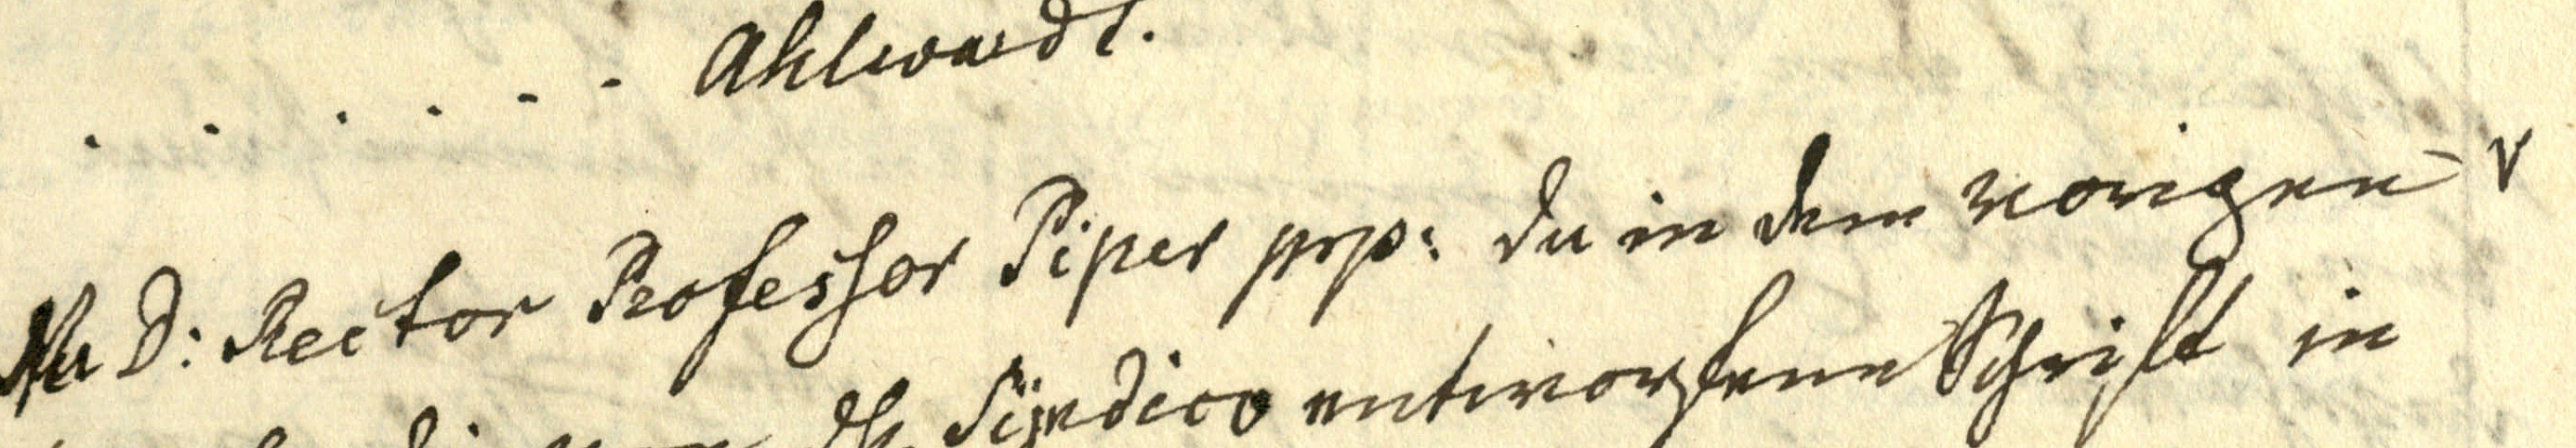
M. D. Rector Professor Piper prp da in dem vorigen
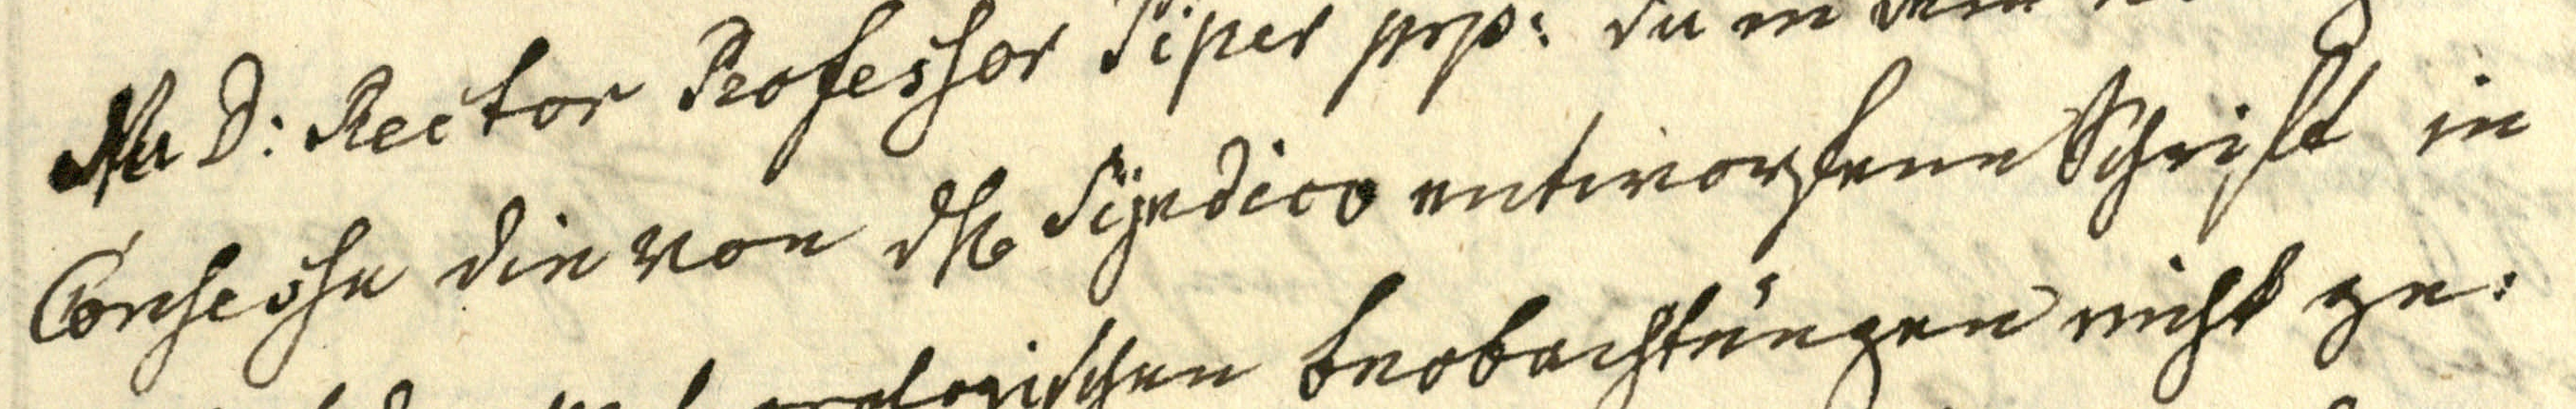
Consessu die von dh Sÿndico entworfene Schrift in
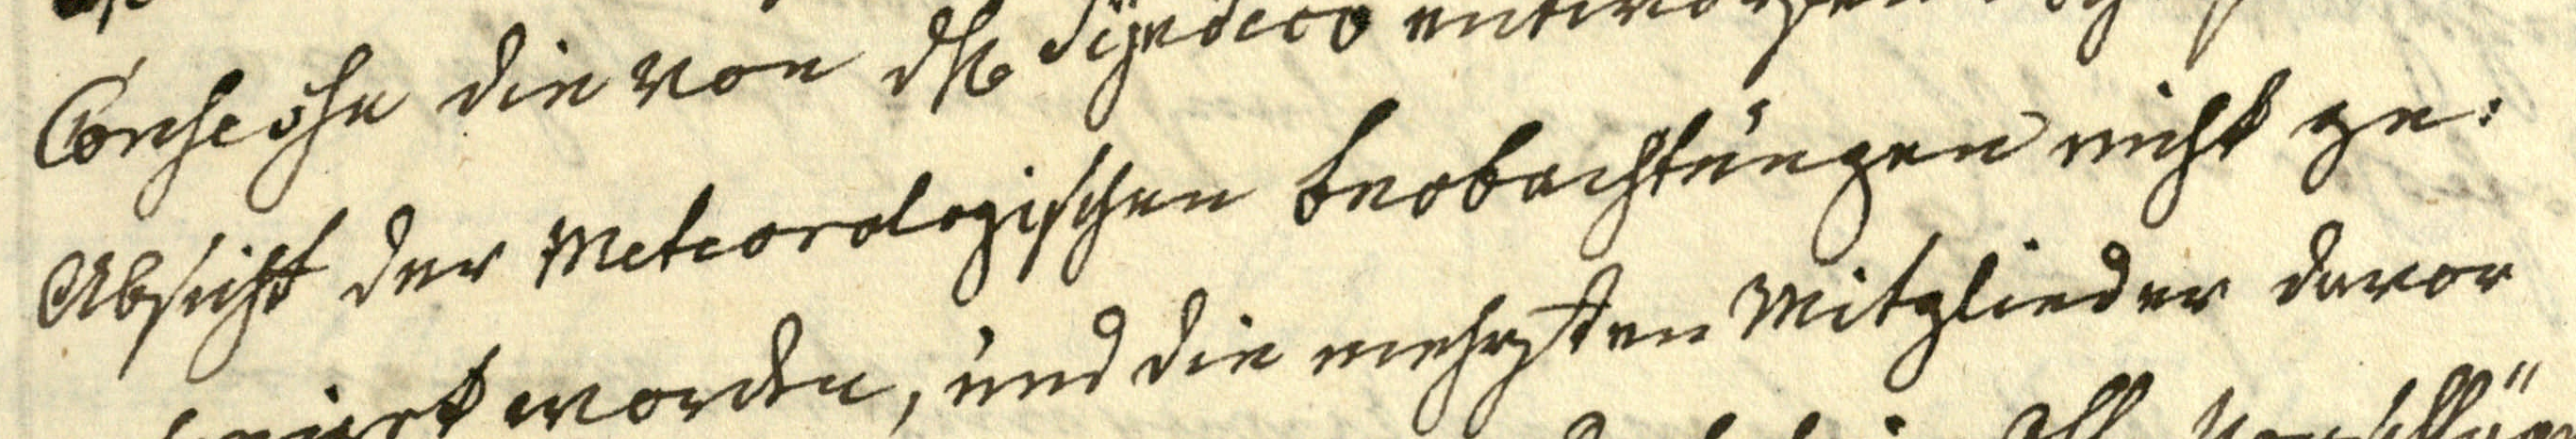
Absicht der Meteorologischen Beobachtungen nicht ge¬
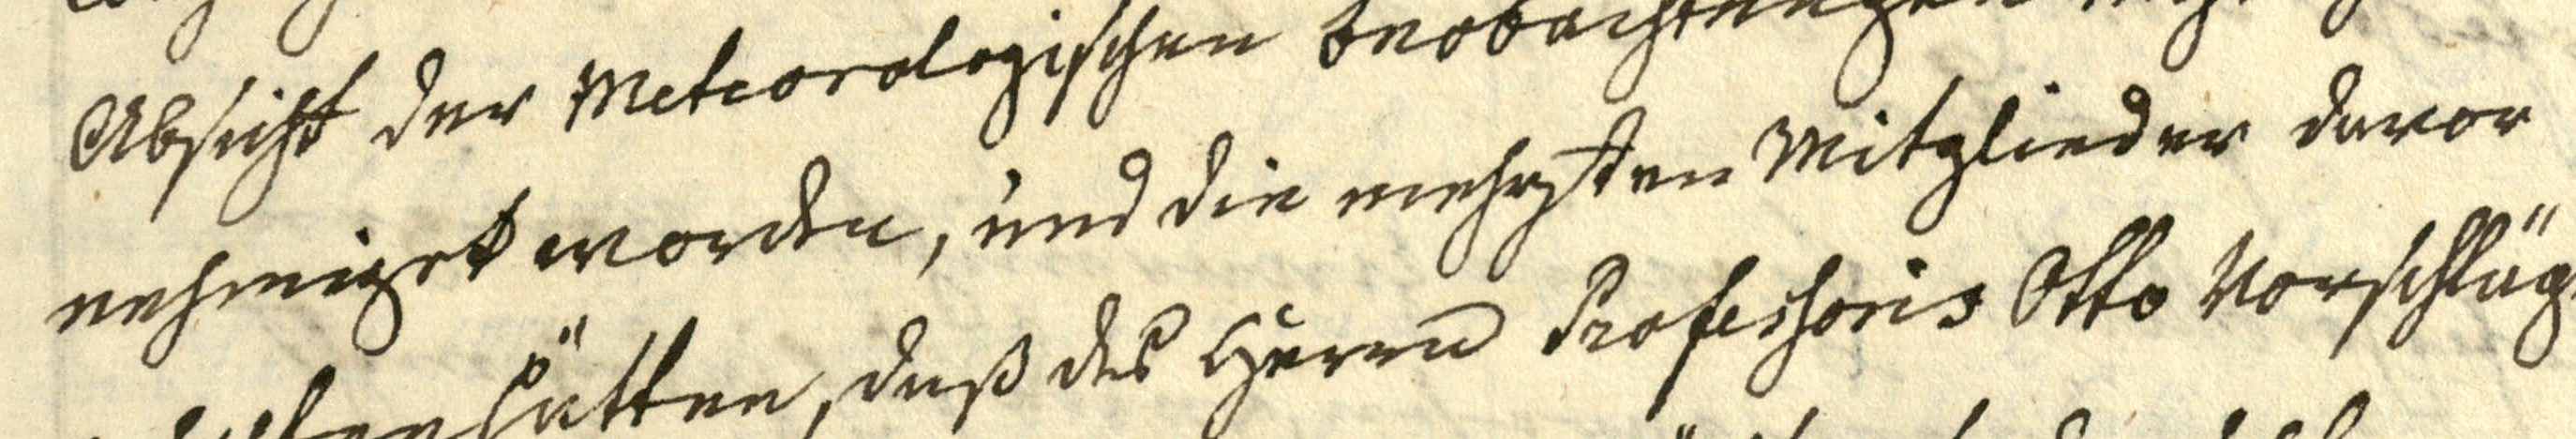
nehmiget worden, und die mehrsten Mitglieder davor
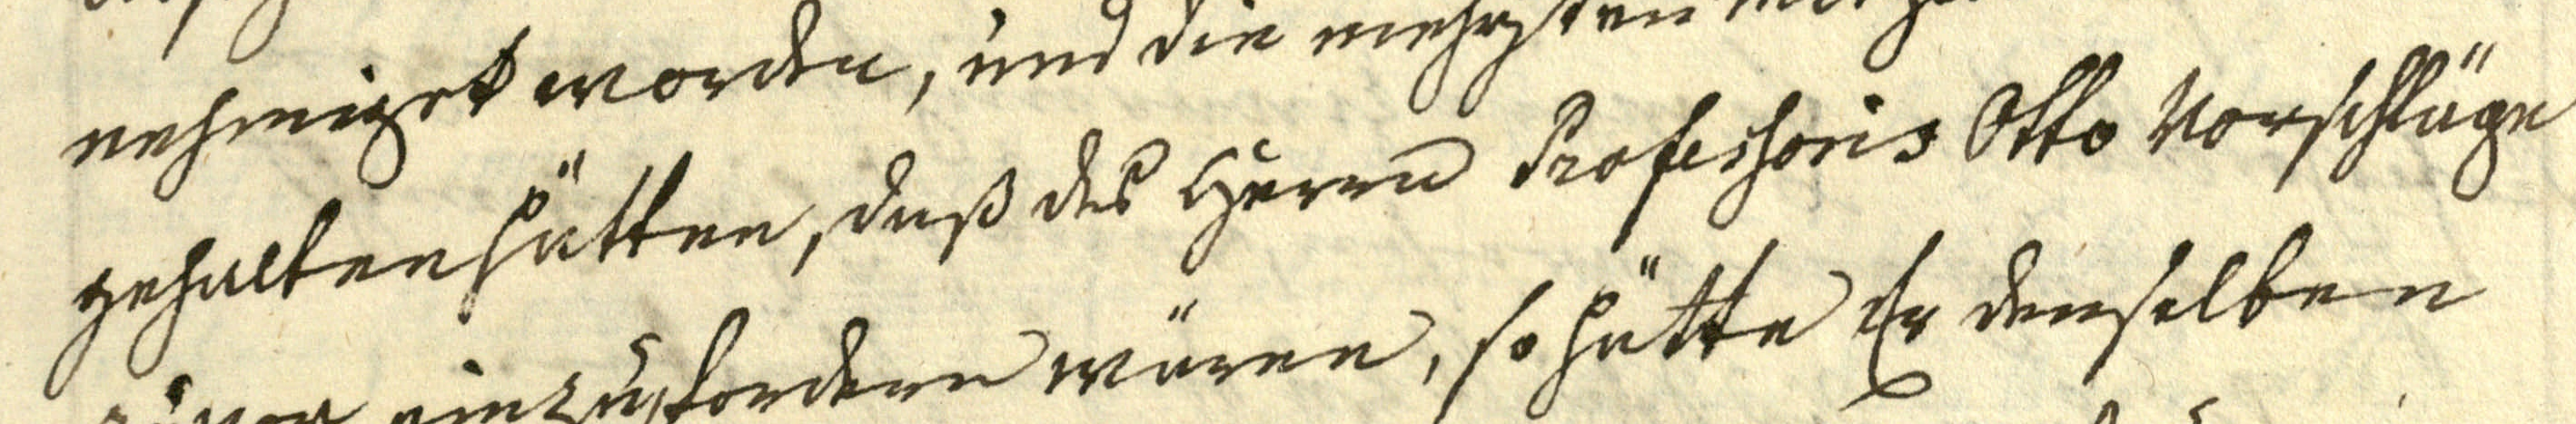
gehalten hätten, daß des Herrn Professoris Otto Vorschläge
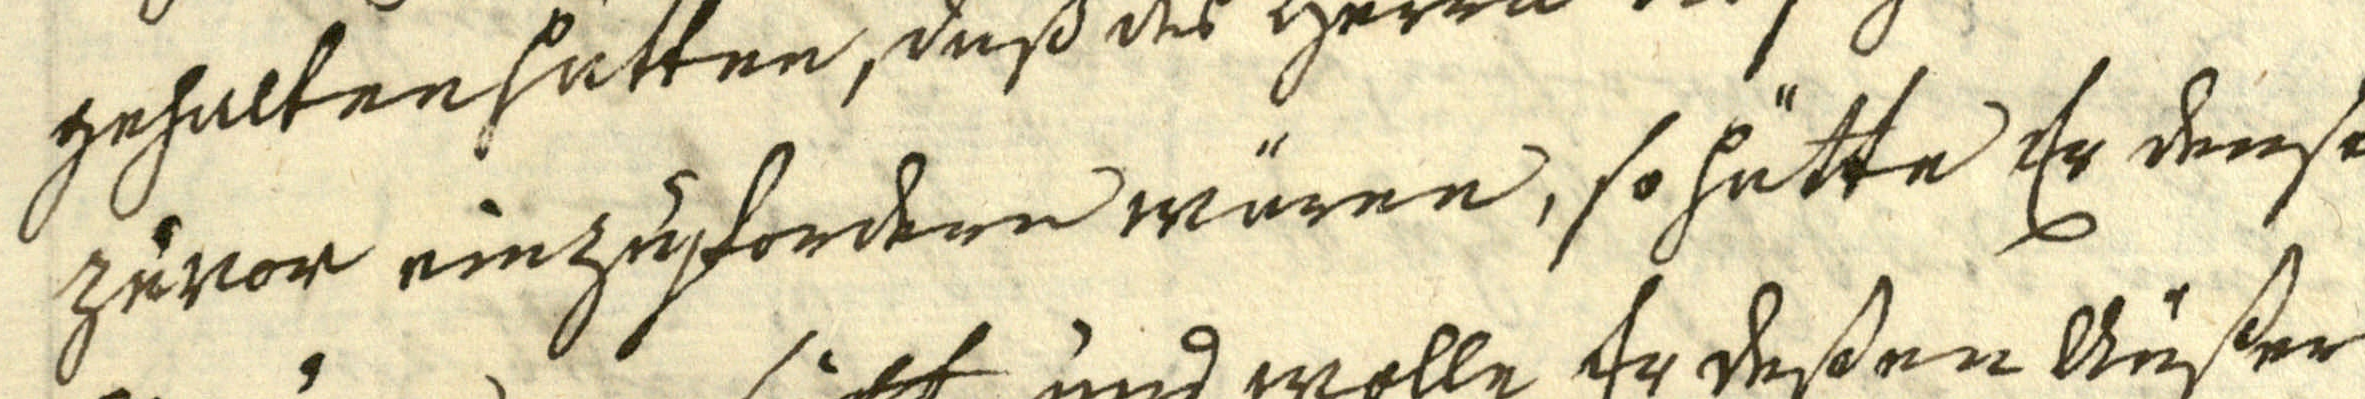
zuvor einzufordern wären, so hätte Er denselben
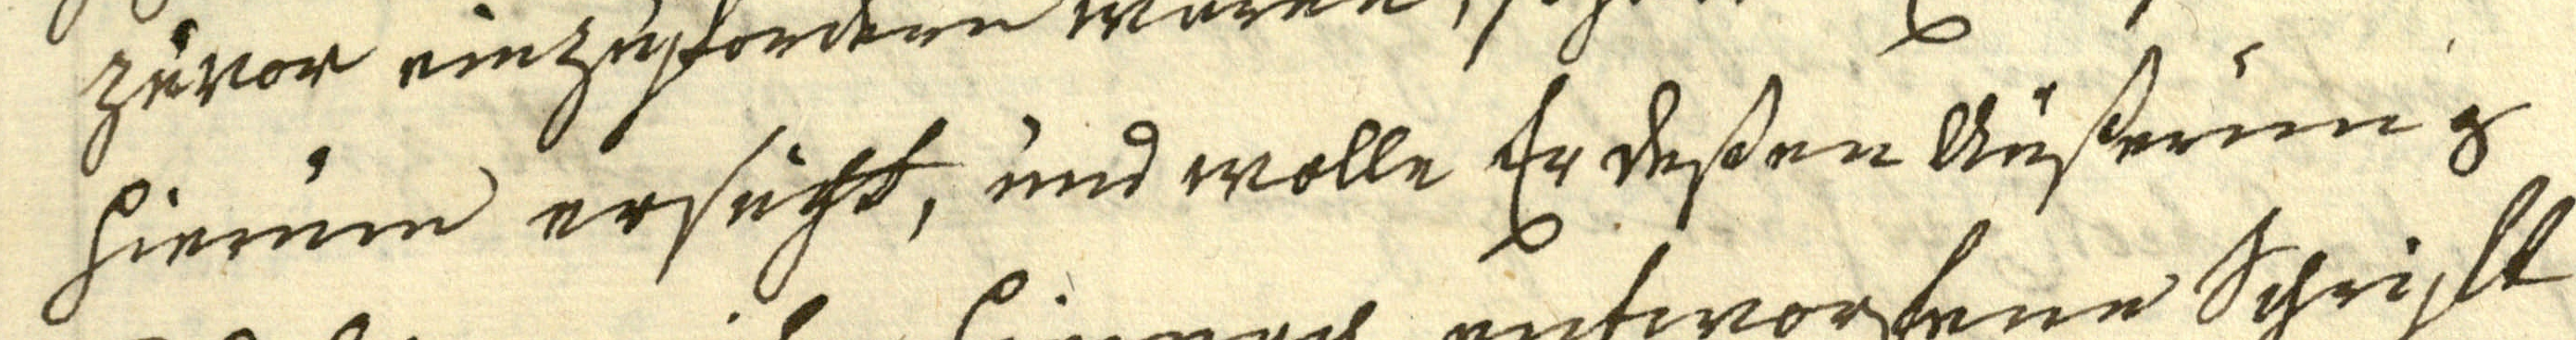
hierin ersucht, und wolle Er deßen Äußerung
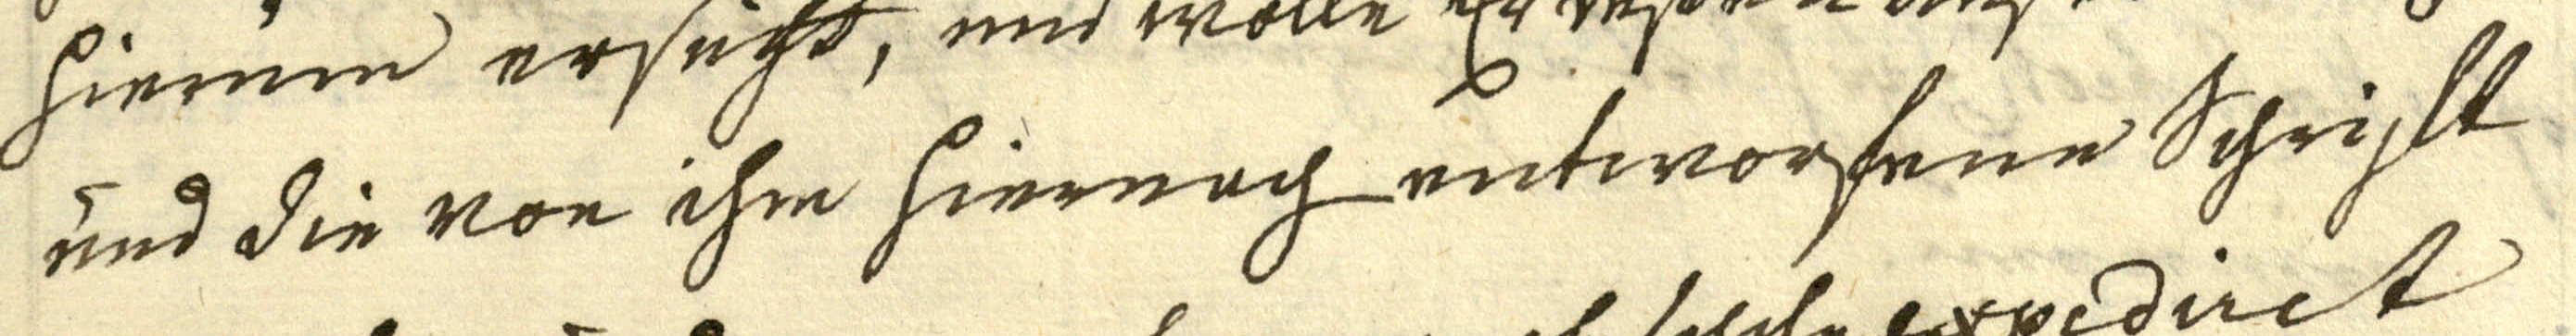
und die von ihm hiernach entworfene Schrift
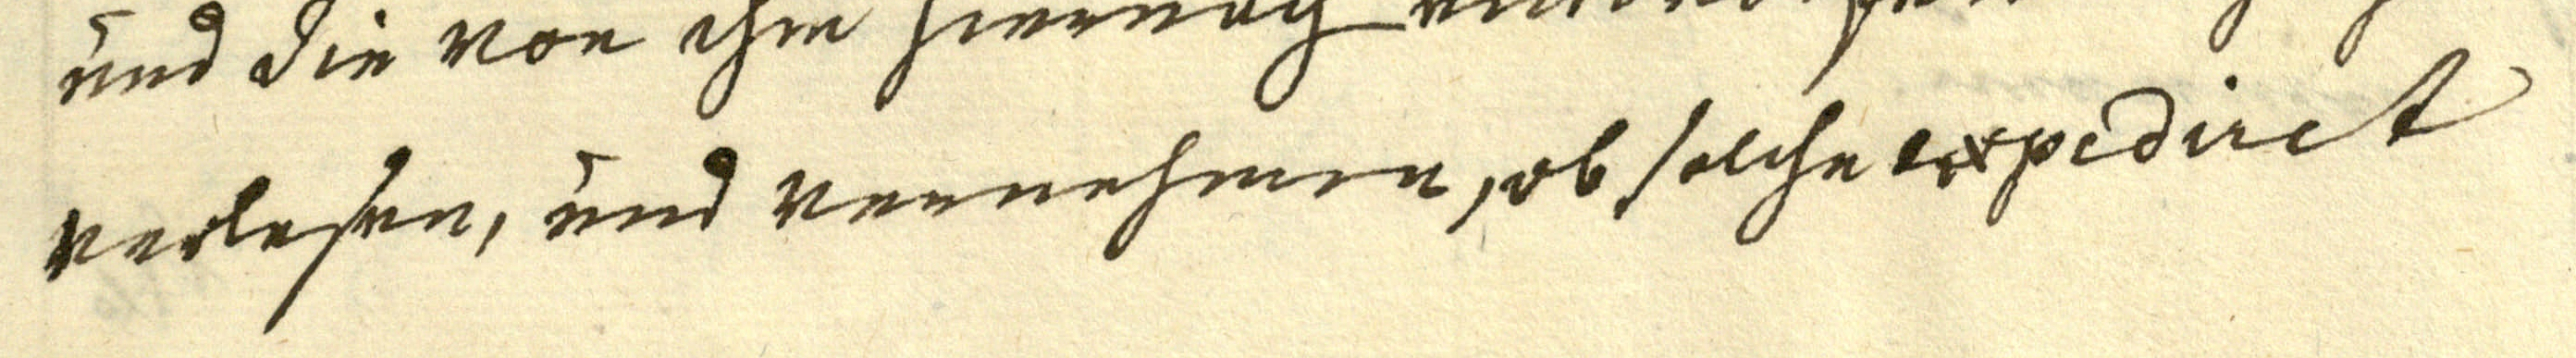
verlesen, und vernehmen, ob solche expediret
